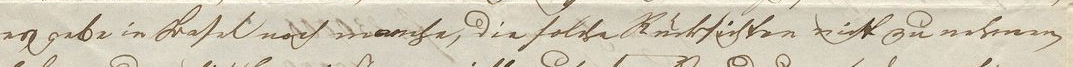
es gebe in Basel noch manche, die solche Rücksichten nicht zu nehmen
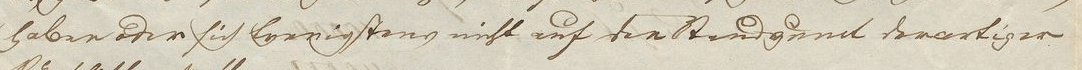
haben oder sich wenigstens nicht auf den Standpunct derartiger
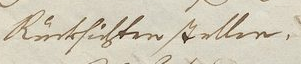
Rücksichten stellen.
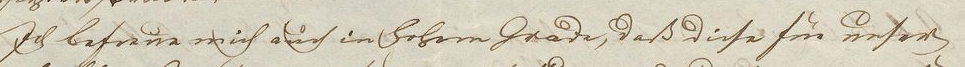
Ich befreue mich auch in hohem Grade, daß diese für unser
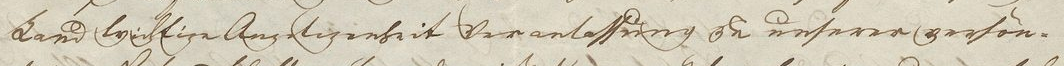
Land wichtige Angelegenheit Veranlassung zu unserer versön-
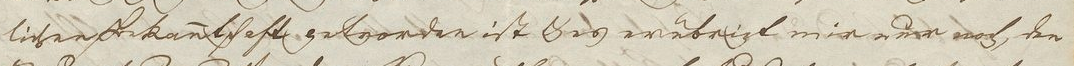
lichen Bekanntschaft geworden ist & es erübrigt mir nur noch, den
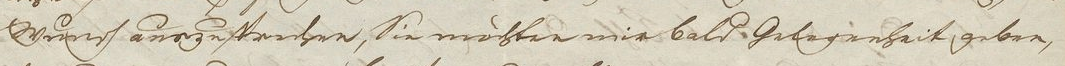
Wunsch auszusprechen, Sie möchten mir bald Gelegenheit geben,
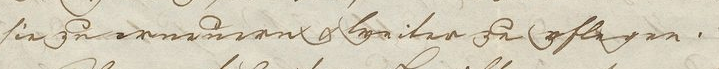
sie zu erneuern & weiter zu pflegen.
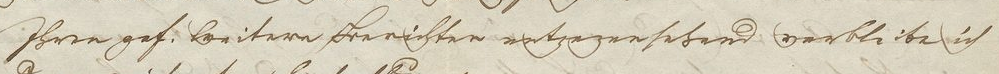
Ihren gef. weitern Berichten entgegensehend verbleibe ich
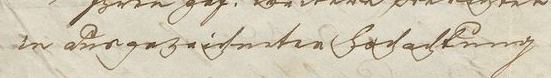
in ausgezeichneter Hochachtung.
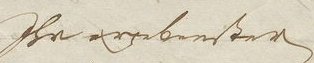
Ihr ergebenster
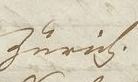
Zürich.
